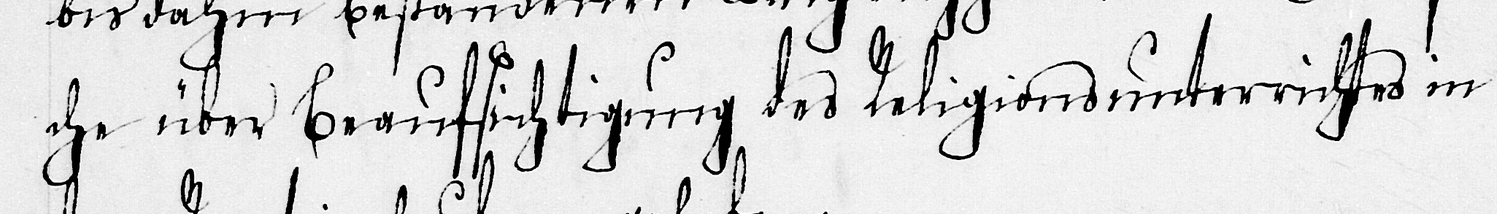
che über Beaufsichtigung des Religionsunterrichtes in
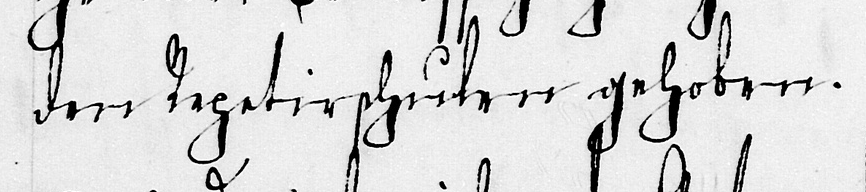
den Repetirschulen gehoben.
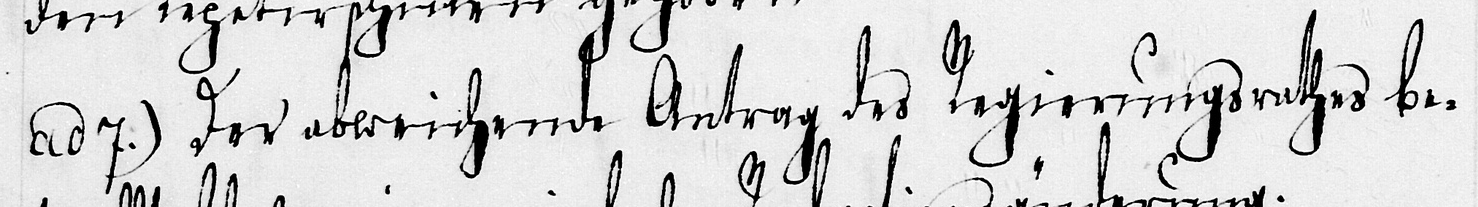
ad 7.) Der abweichende Antrag des Regierungsrathes be¬
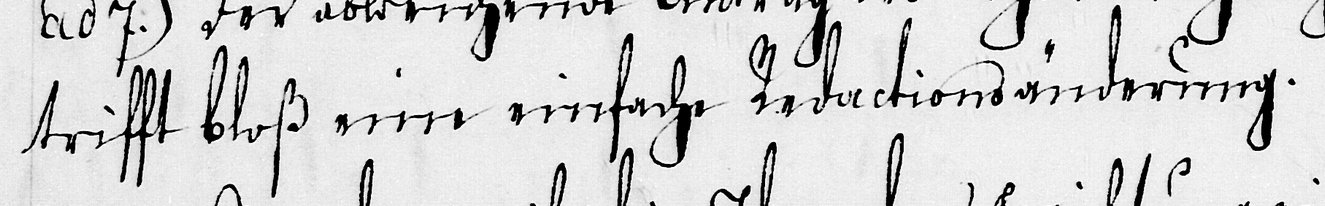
trifft bloß eine einfache Redactionsänderung.
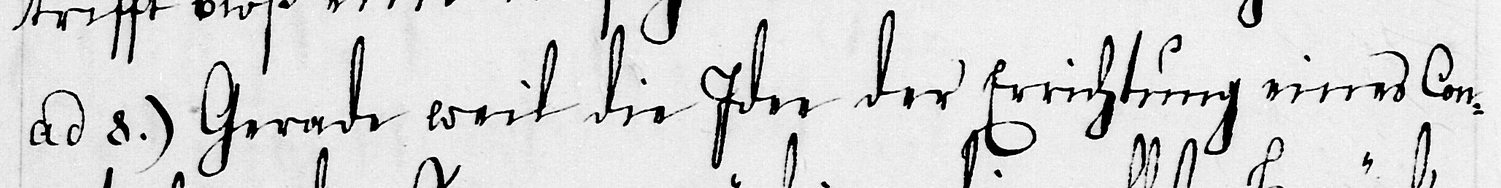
ad 8.) Gerade weil die Idee der Errichtung eines Con¬
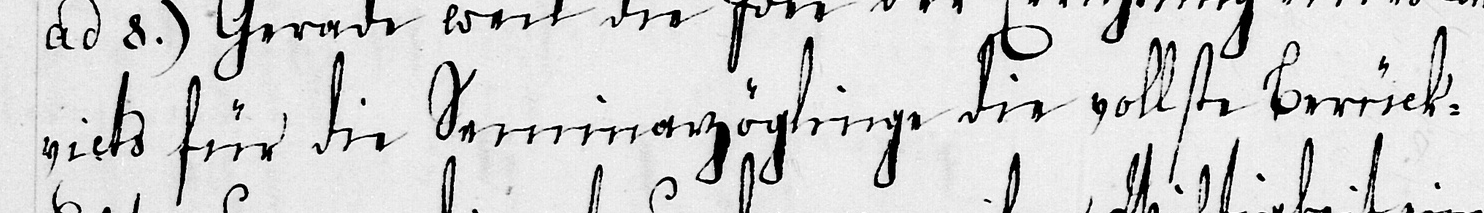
victs für die Seminarzöglinge die vollste Berück¬
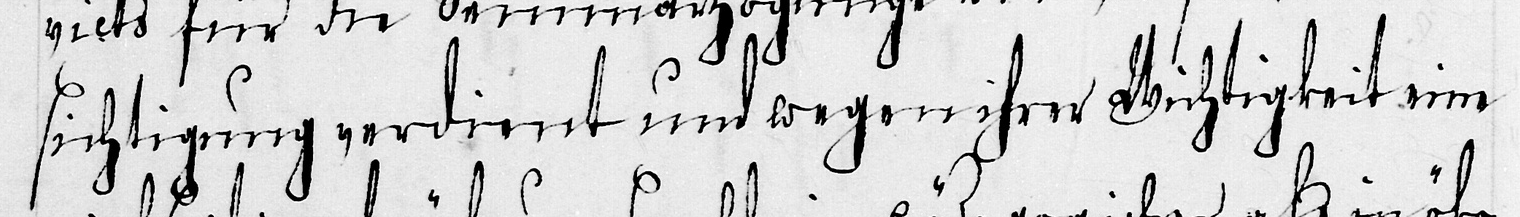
sichtigung verdient und wegen ihrer Wichtigkeit eine
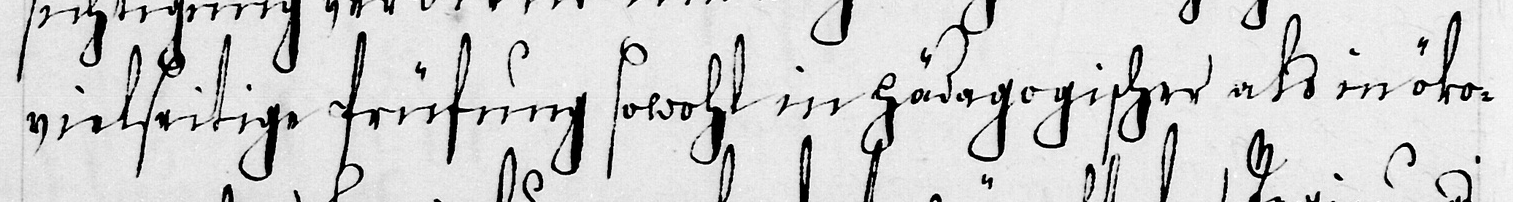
vielseitige Prüfung sowohl in pädagogischer als in öko¬
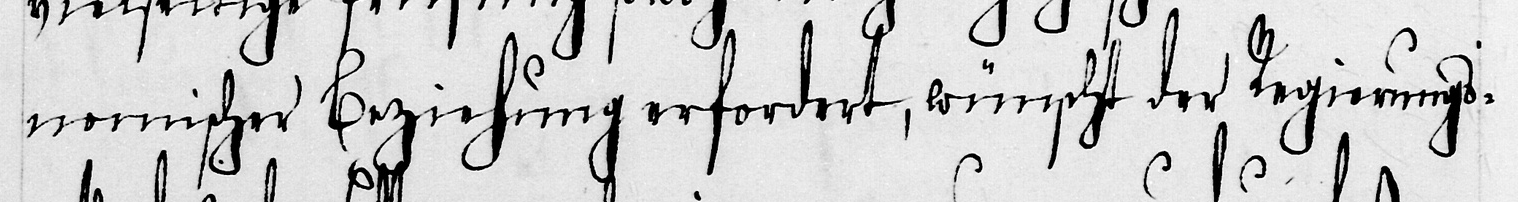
nomischer Beziehung erfordert, wünscht der Regierungs¬
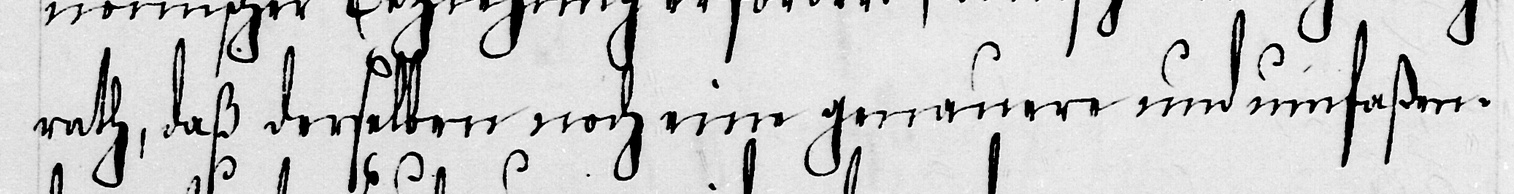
rath, daß derselben noch eine genauere und umfaßen¬
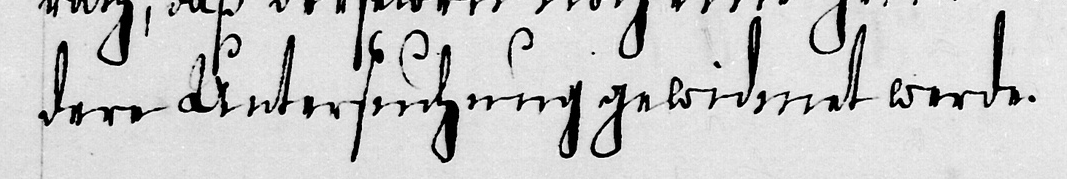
dere Untersuchung gewidmet werde.
